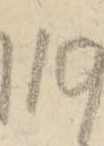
119
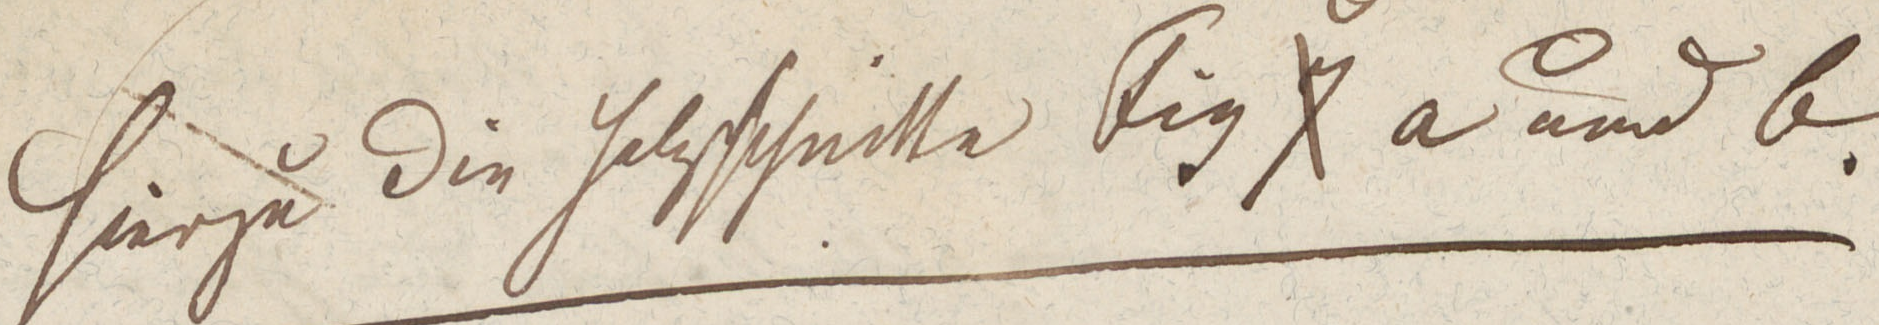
Hierzu die Holzschnitte Fig 7 6 a und b
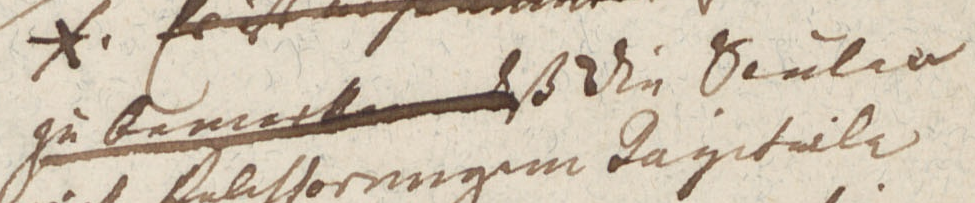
zu bemerken dass dDie Säulen
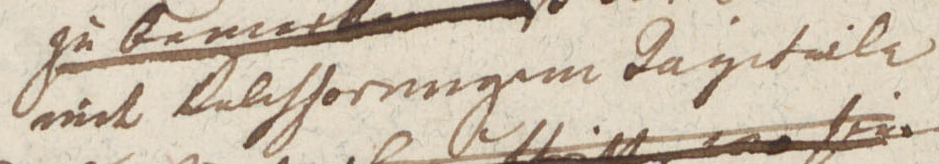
mit kelchformigem Kapitäle
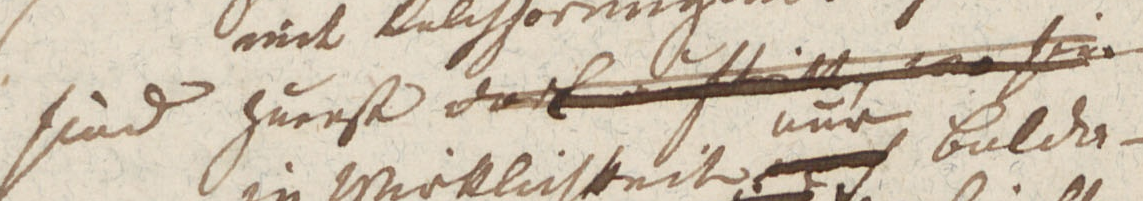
sind zuerst dort auftritt, wo sie
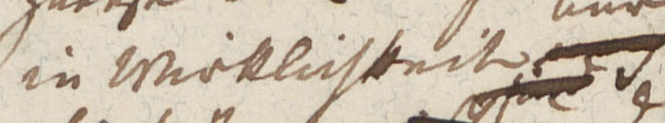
in Wirklichkeit noch nur
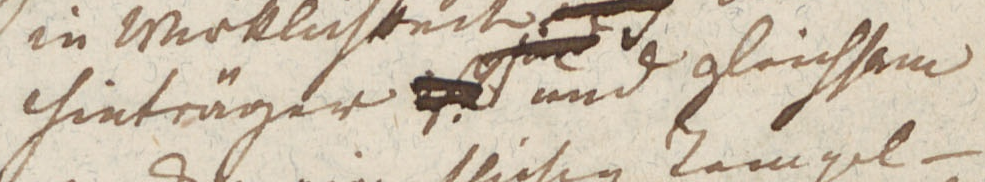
chinträger ist sind und gleichsam
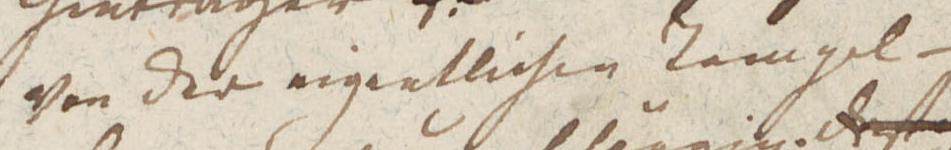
von der eigentlichen Tempel-
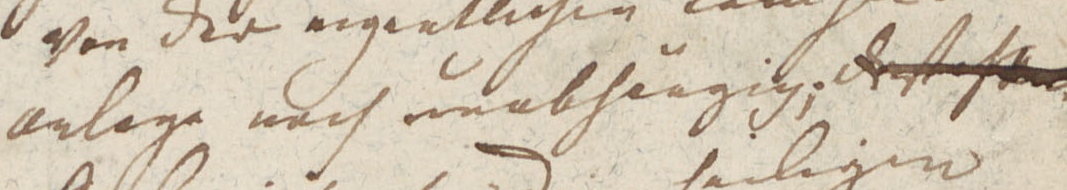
anlage noch unabhängig; dastehen
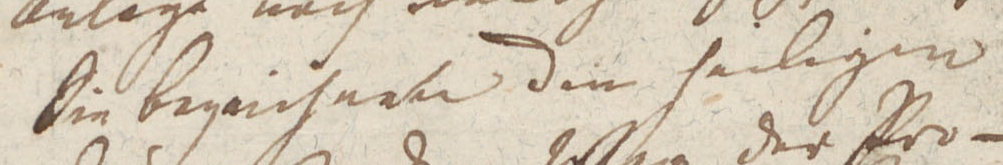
Sie bezeichnen den heiligen
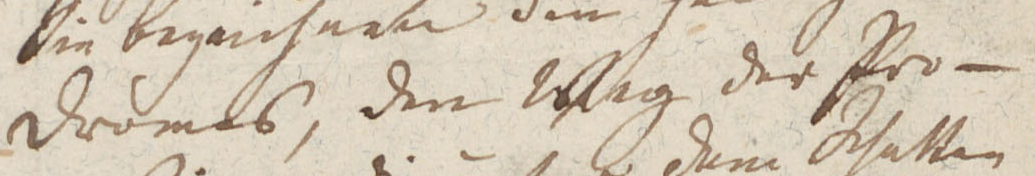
Dromos, den Weg der Pro-
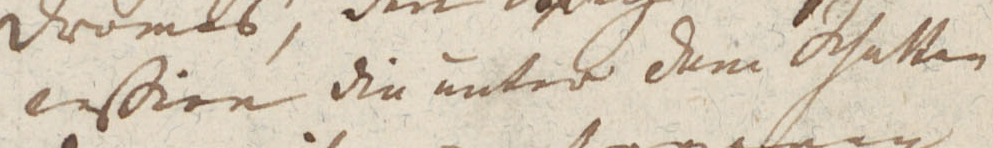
cession die unter dem Schatten
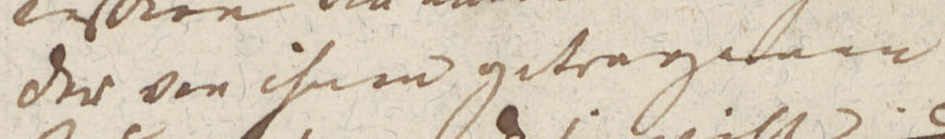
der von ihnen getragenen
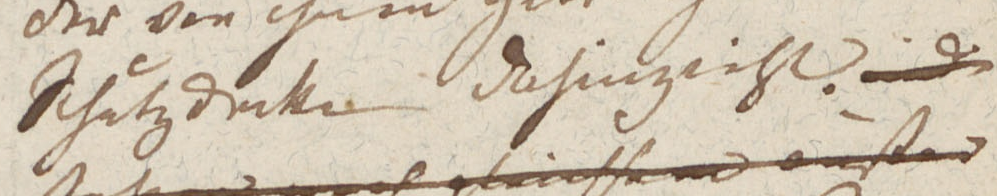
Schutzdecke dahinzieht. und
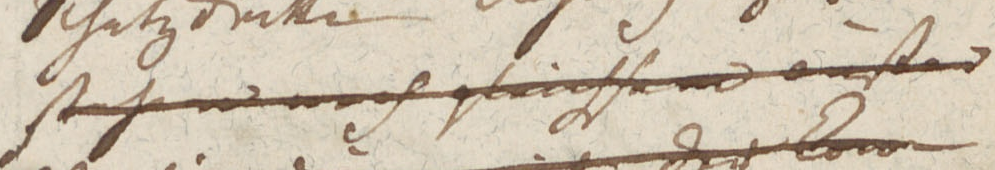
stehen noch gleichsam ausser
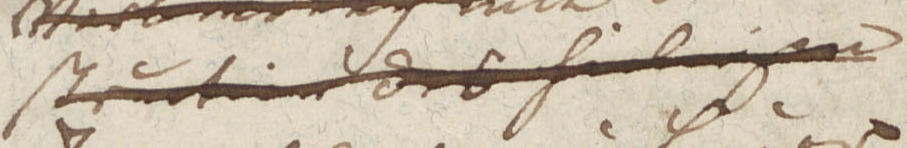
struction des heiligen
